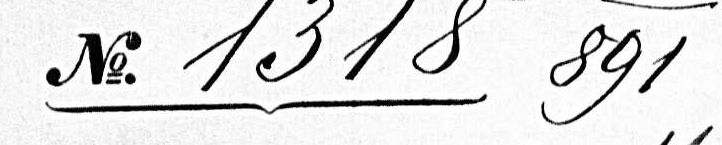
No 1318 – 1891
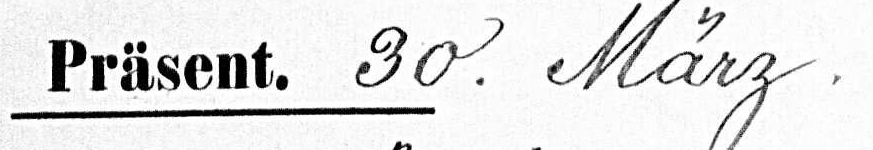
Präsent. – 30. März
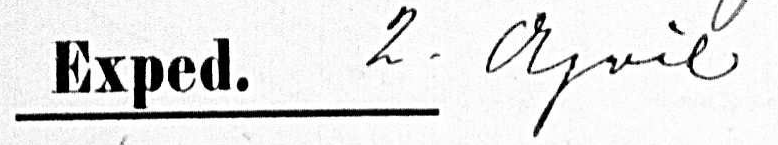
Exped. – 2. April
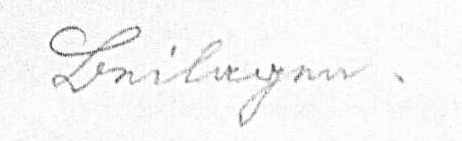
Beilagen
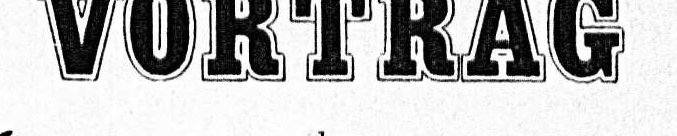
VORTRAG
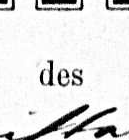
des
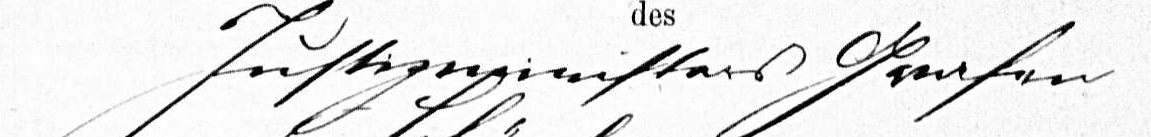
Justizministers Gfn
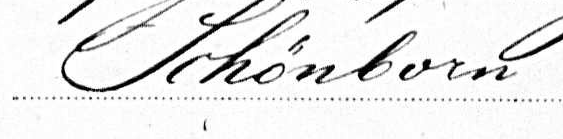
Schönborn
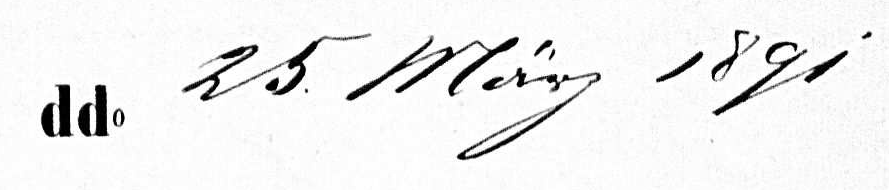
Ddo 25. März 1891
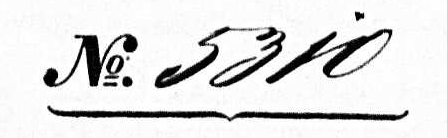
No. 5310
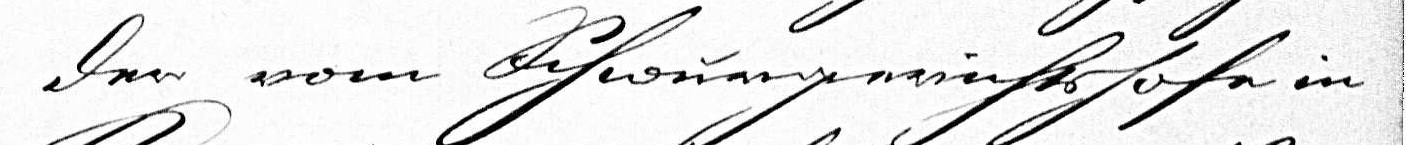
der vom Schwurgerichtshofe in
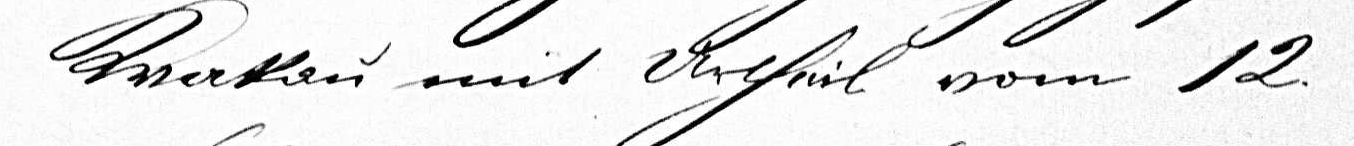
Krakau mit Urtheil vom 12.
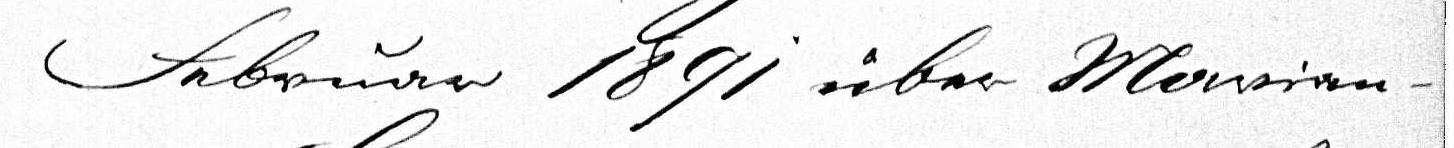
Februar 1891 über Marian¬
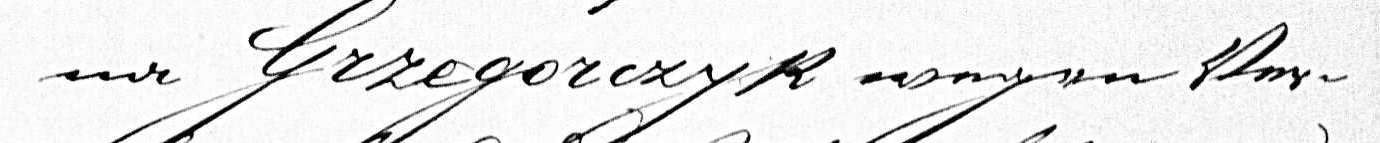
na Grzegorczyk wegen Ver¬
